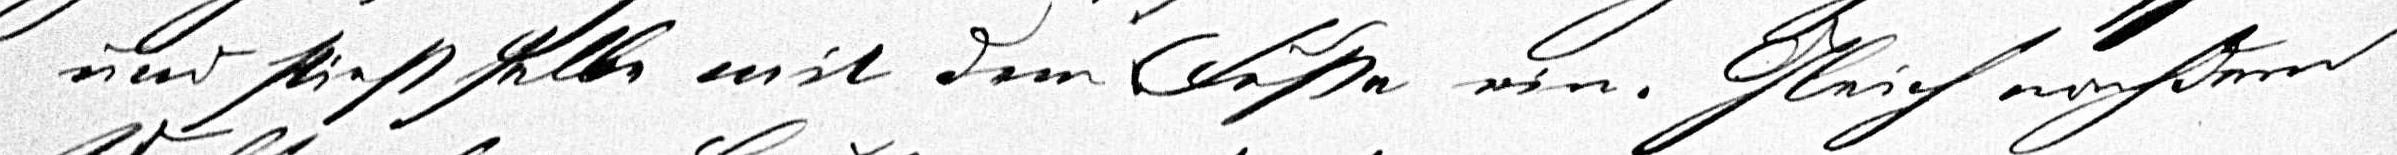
und stieß selbe mit dem Fuße ein. Gleich nachdem
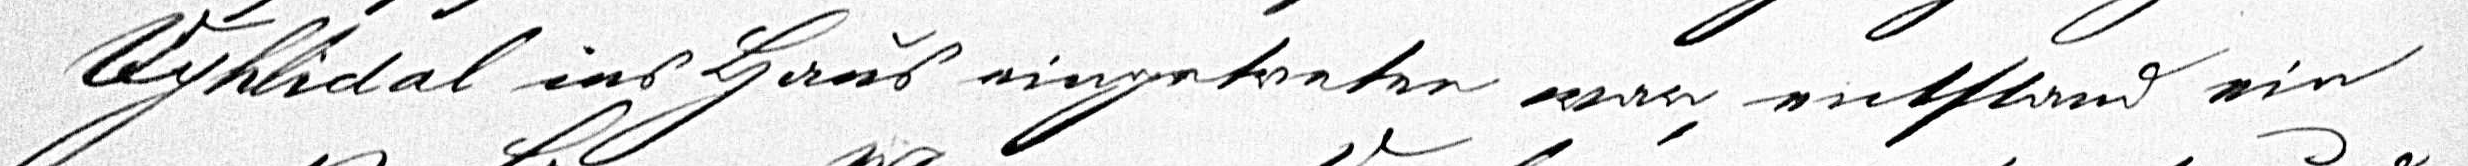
Vyhlidal ins Haus eingetreten war, entstand ein
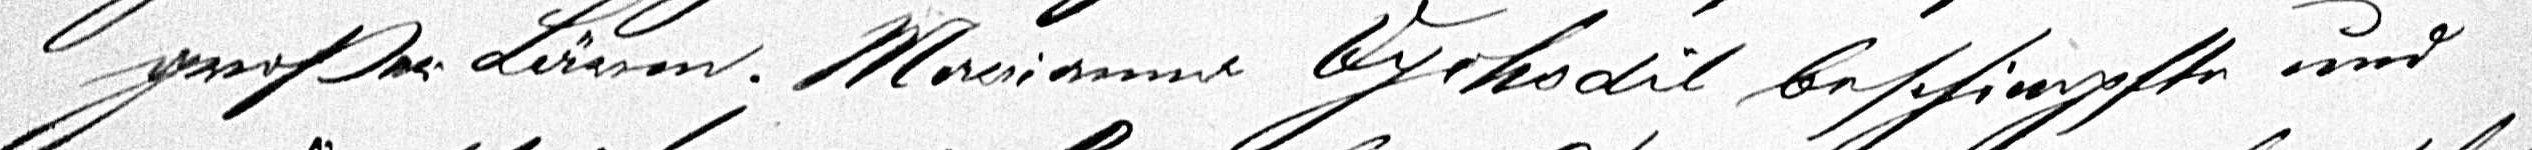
großer Lärm. Marianna Vychodil beschimpfte und
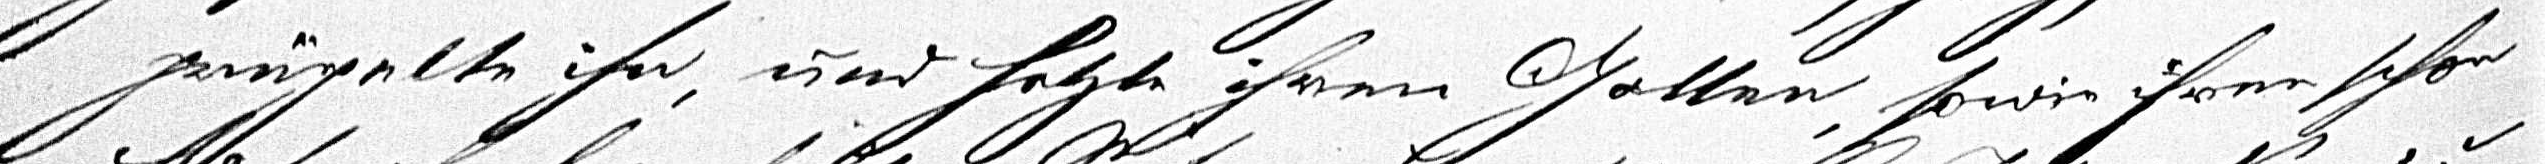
prügelte ihn, und setzte ihren Gatten, sowie ihren schon
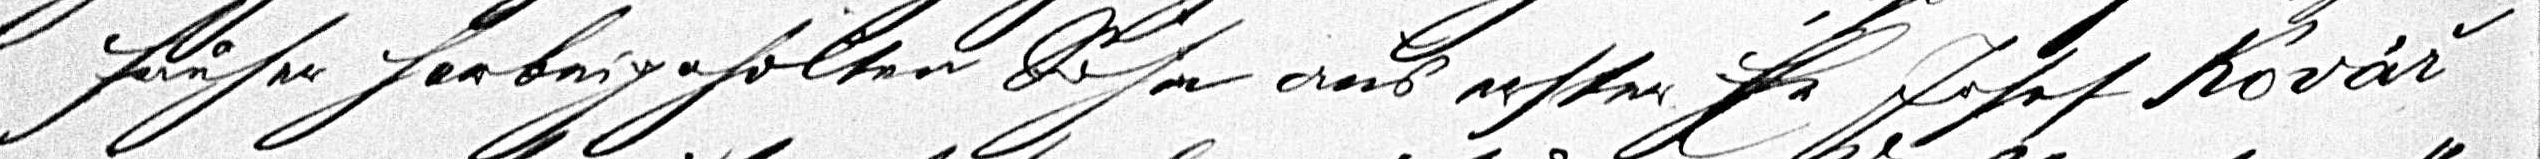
früher herbeigeholten Sohn aus erster Ehe Josef Kovár
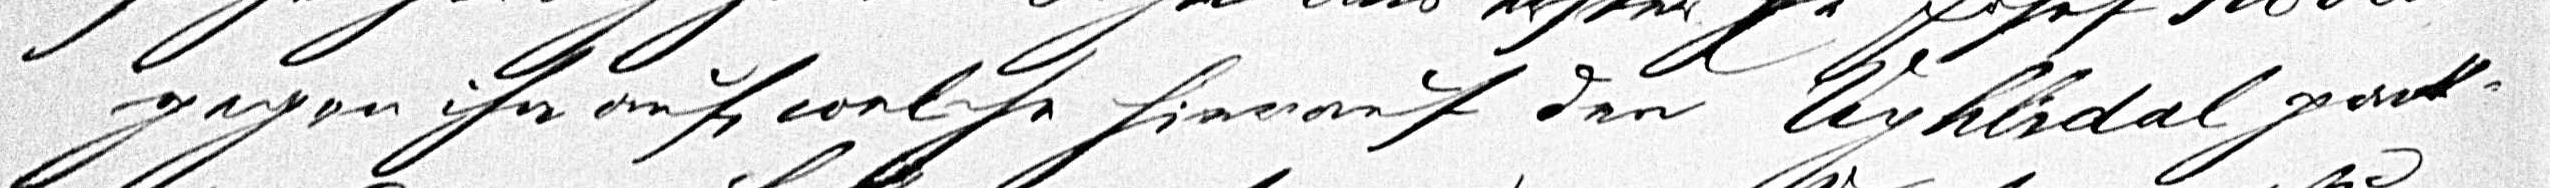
gegen ihn auf welche hierauf den Vyhlidal pack¬
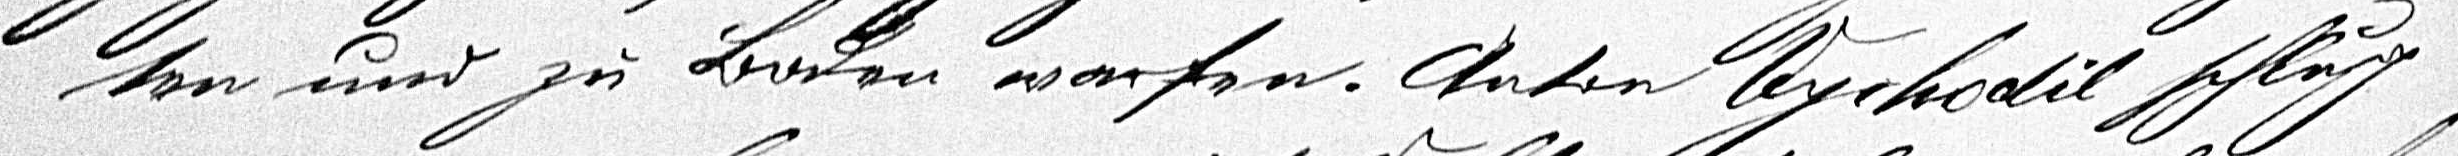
ten und zu Boden warfen. Anton Vychodil schlug
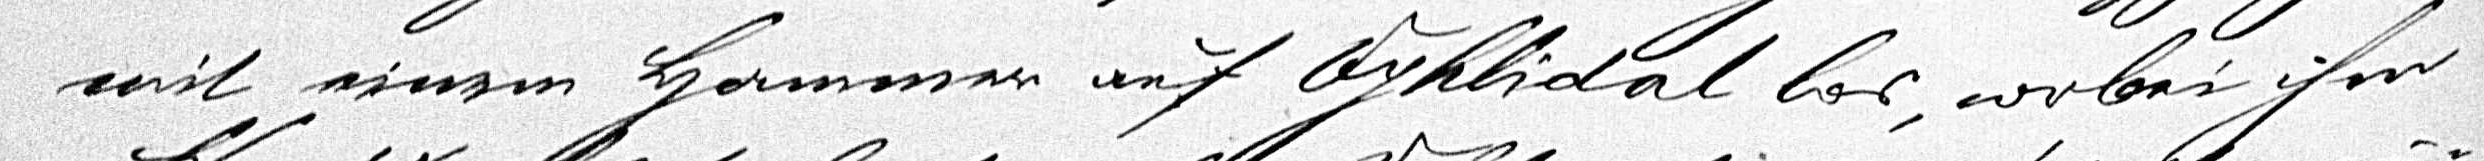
mit einem Hammer auf Vyhlidal los, wobei ihm
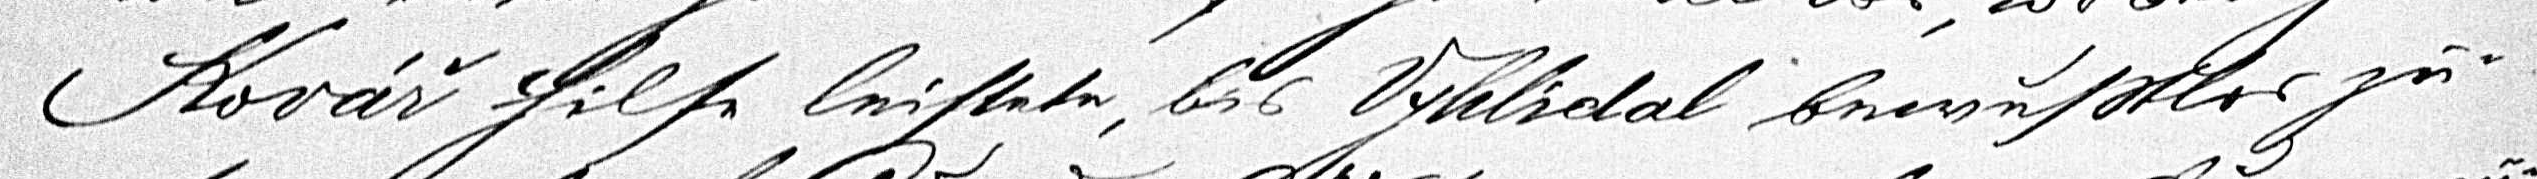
Kovár Hilfe leistete, bis Vyhlidal bewußtlos zu¬
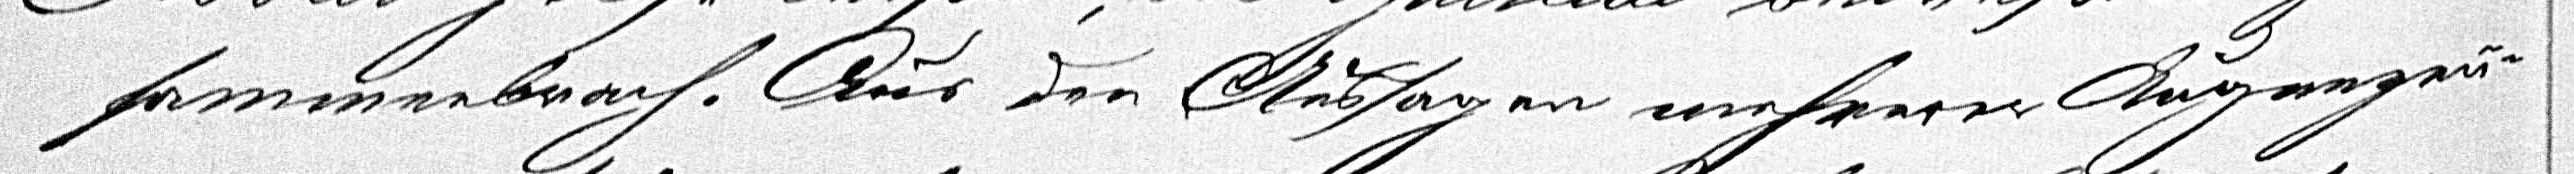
sammenbrach. Aus den Aussagen mehrerer Augenzeu¬
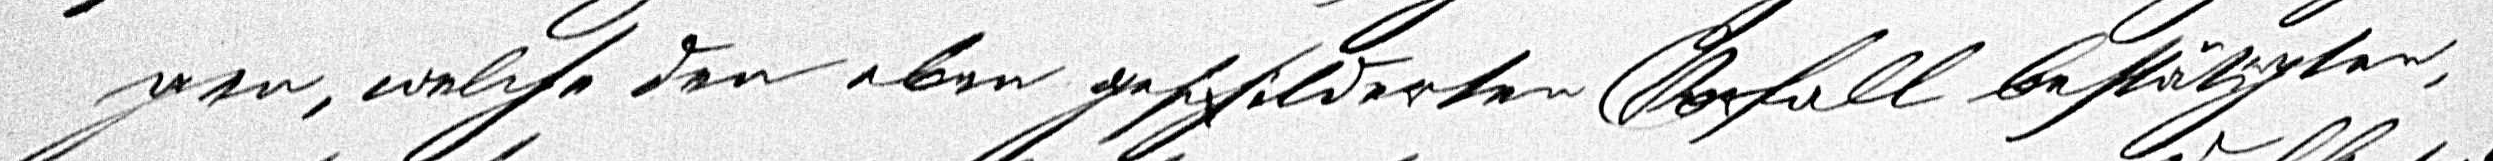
gen, welche den eben geschilderten Vorfall bestätigten,
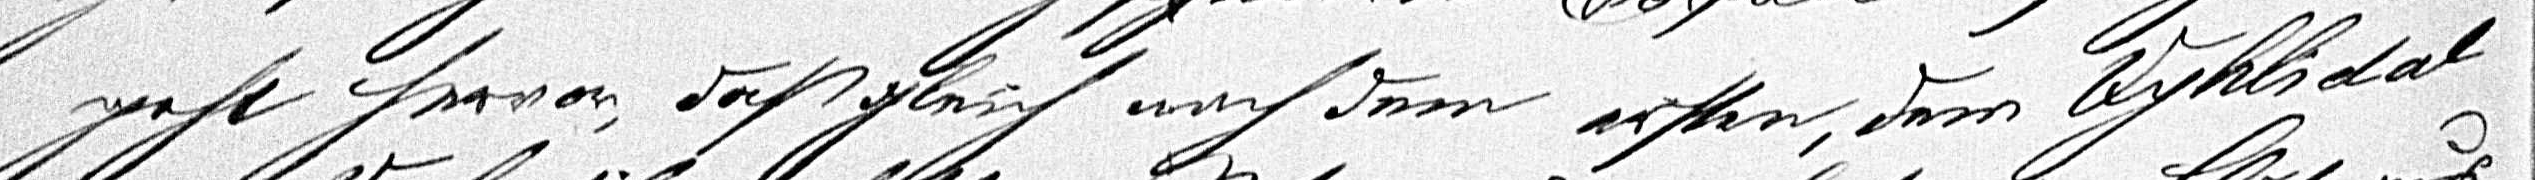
geht hervor, daß gleich nach dem ersten, dem Vyhlsdal
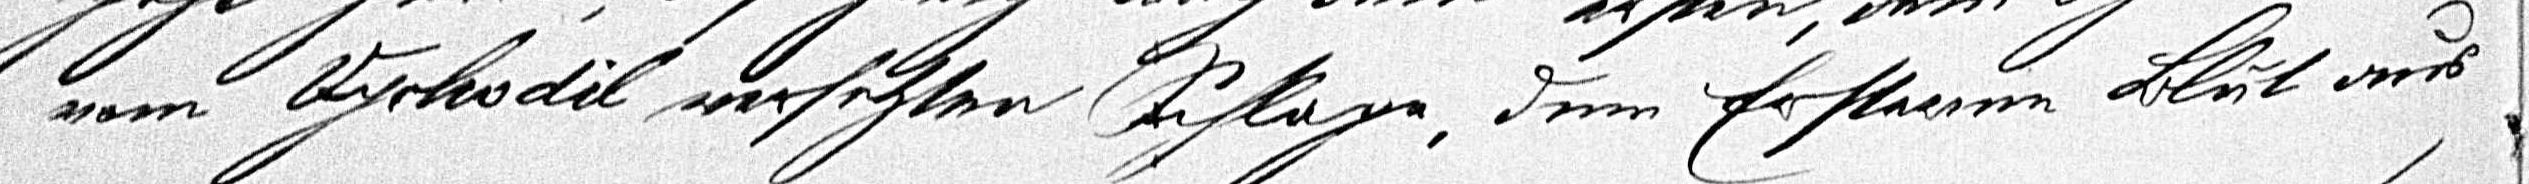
vom Vychodil versetzten Schlage, dem Ersteren Blut aus
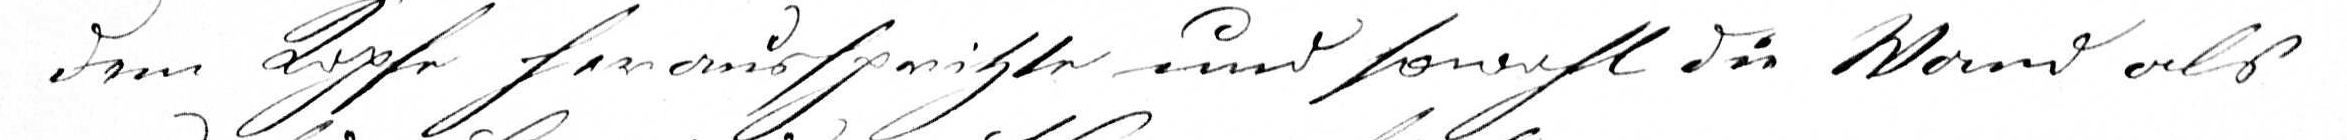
dem Kopfe herausspritzte und wowohl die Wand als
